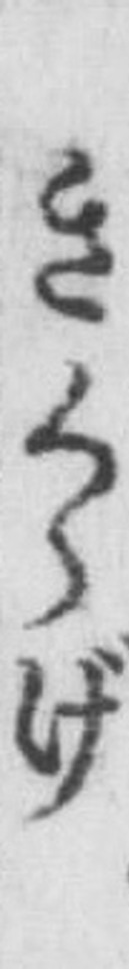きくらげ
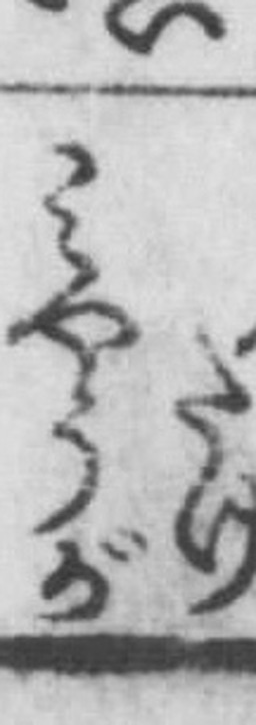ミやうが
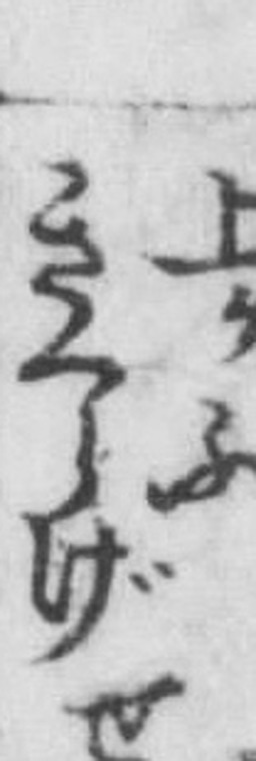きくらげ
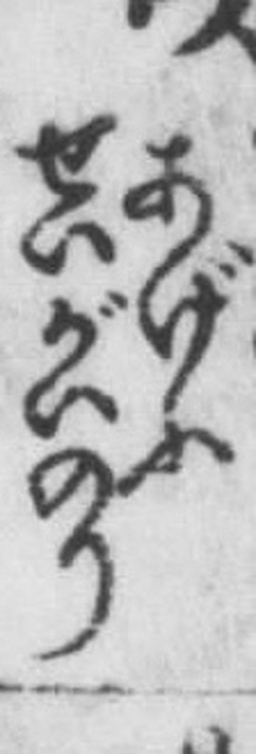せいがいのり
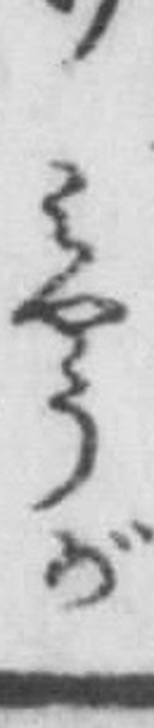ミやうが
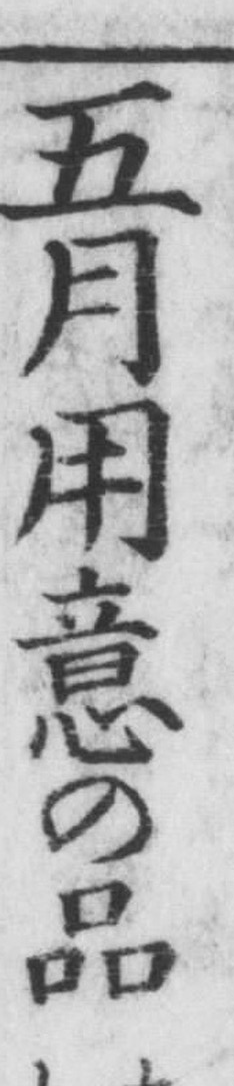五月用意の品
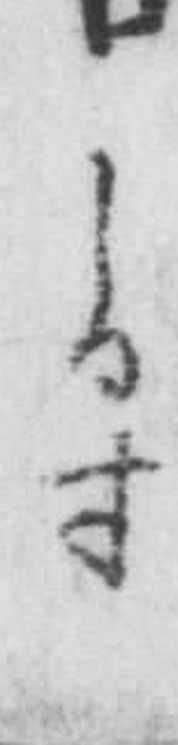しるす
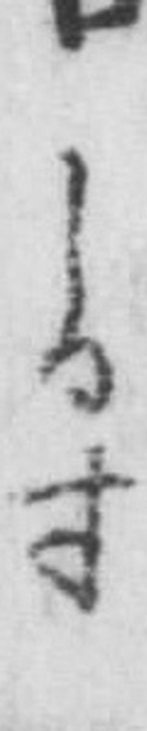しるす
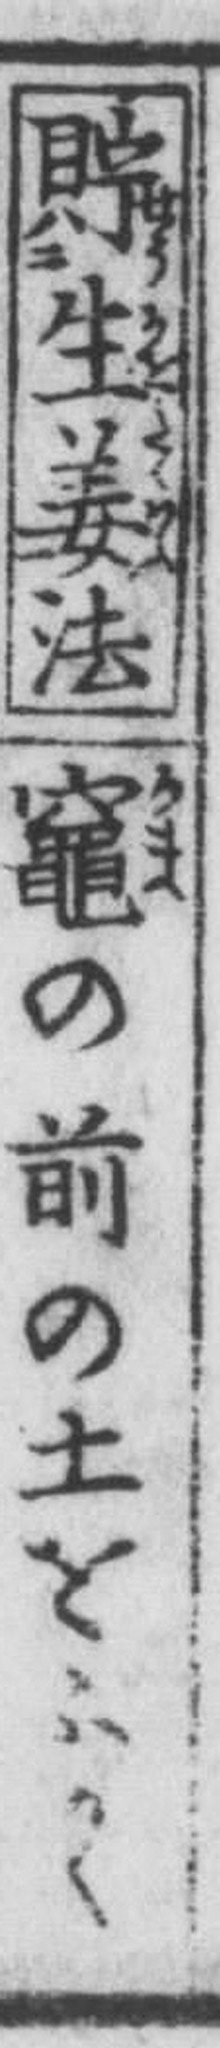貯生姜法竃の前の土をふかく
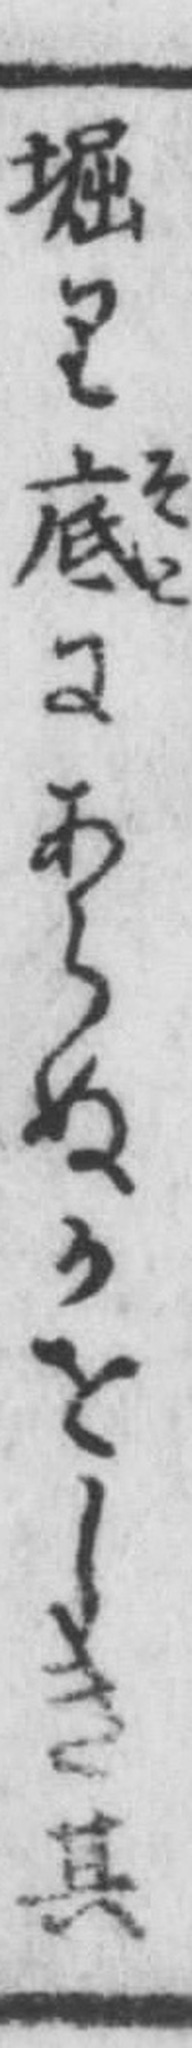掘り底にあらぬかをしき其
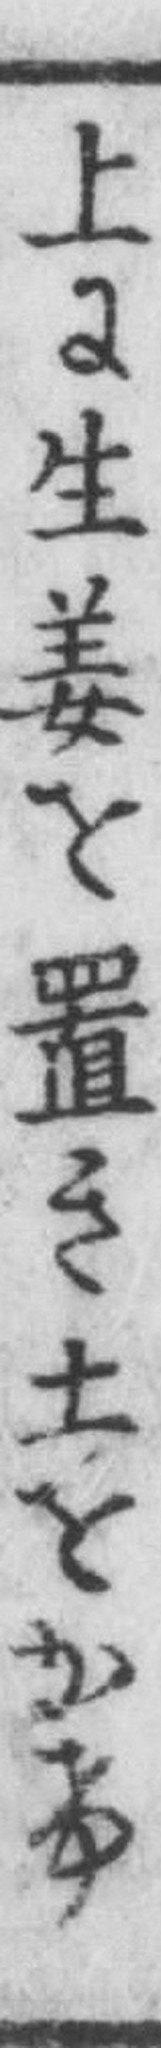上に生姜を置き土をかけ
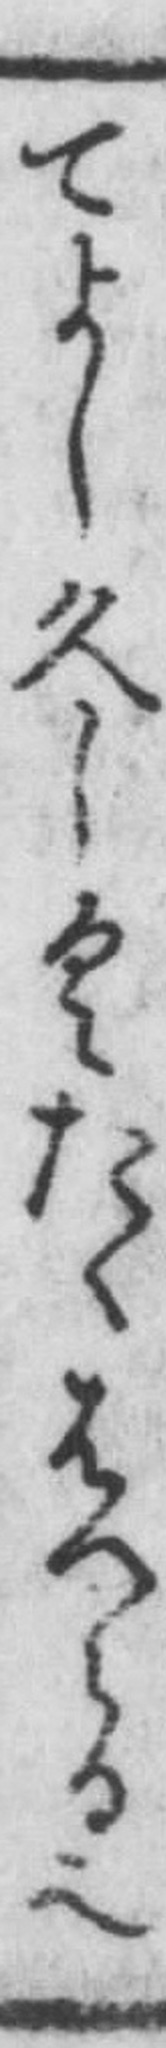てよし久しくたくはへたる也
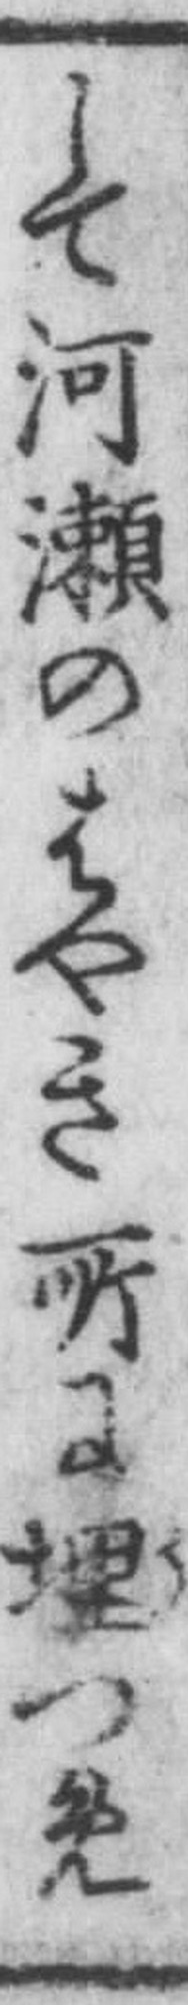して河瀬のはやき所に埋つ先
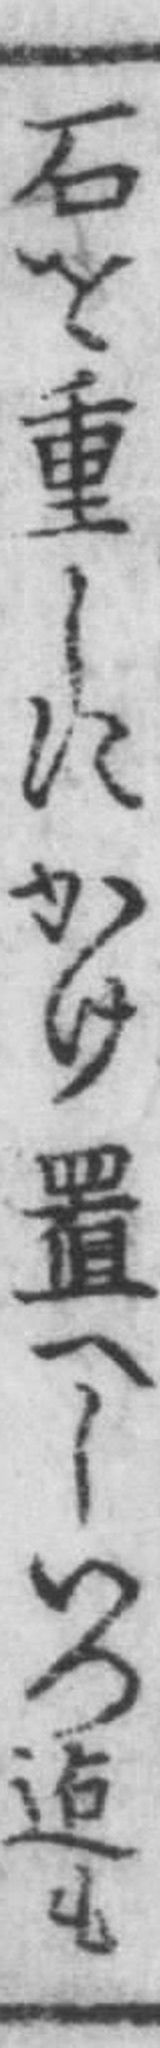石を重しにかけ置へしいつ迄も
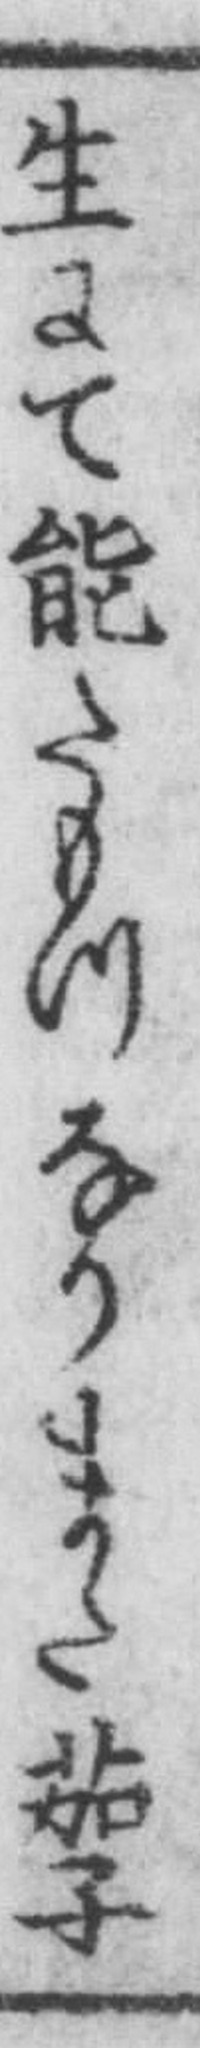生にて能たもつなりまた茄子
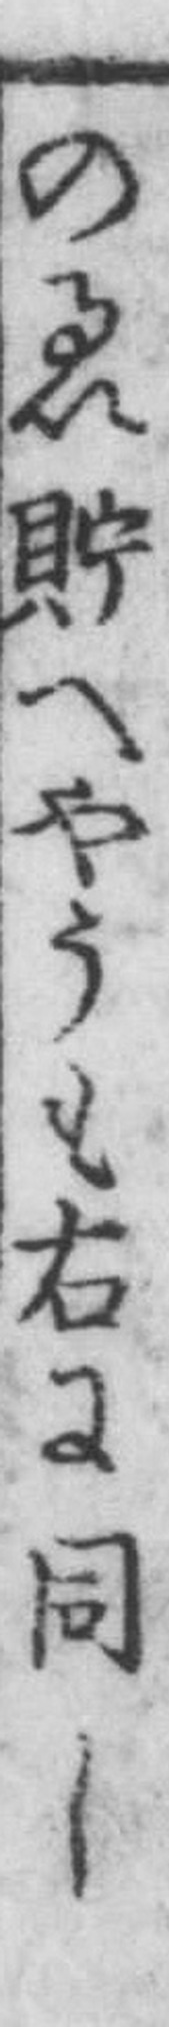のゑ貯へやうも右に同し
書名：当世料理筌
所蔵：大阪府立大学学術情報センター 国文学研究資料館
